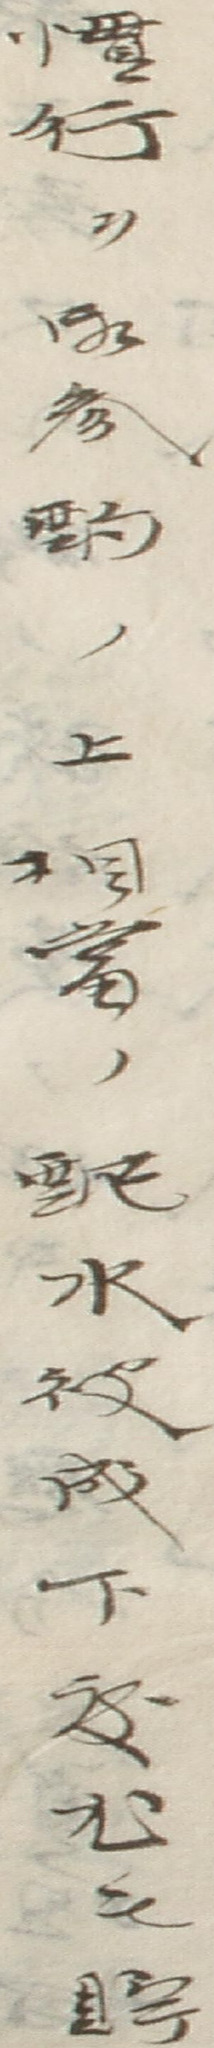慣行ヲ御参酌ノ上相当ノ配水被成下度尤モ貯

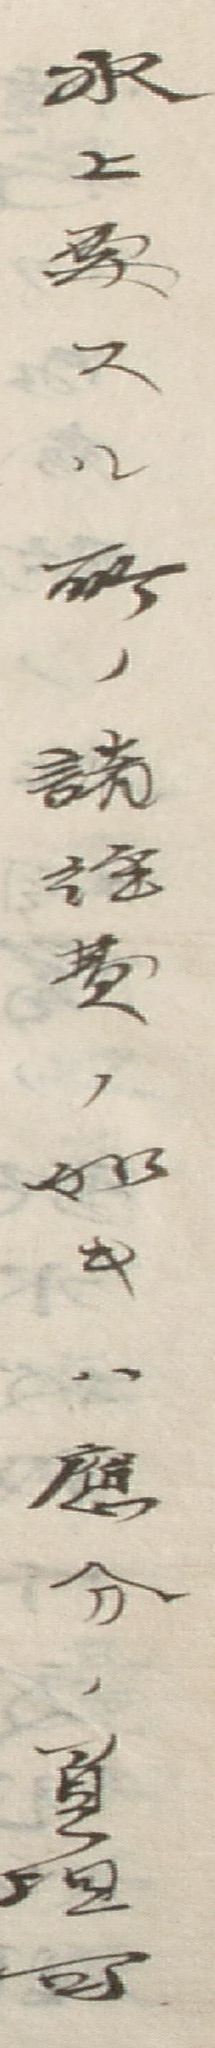水上要スル所ノ諸経費ノ如キハ応分ノ負担可
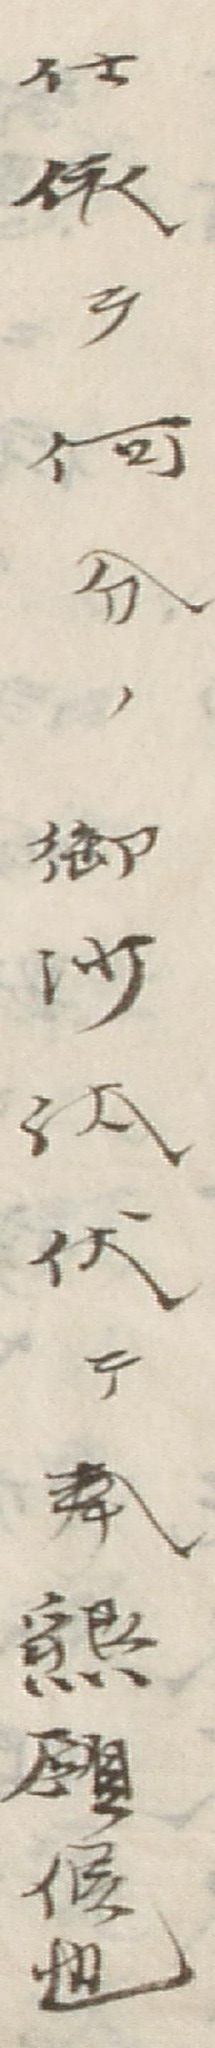仕依テ何分ノ御沙汰伏テ奉懇願候也
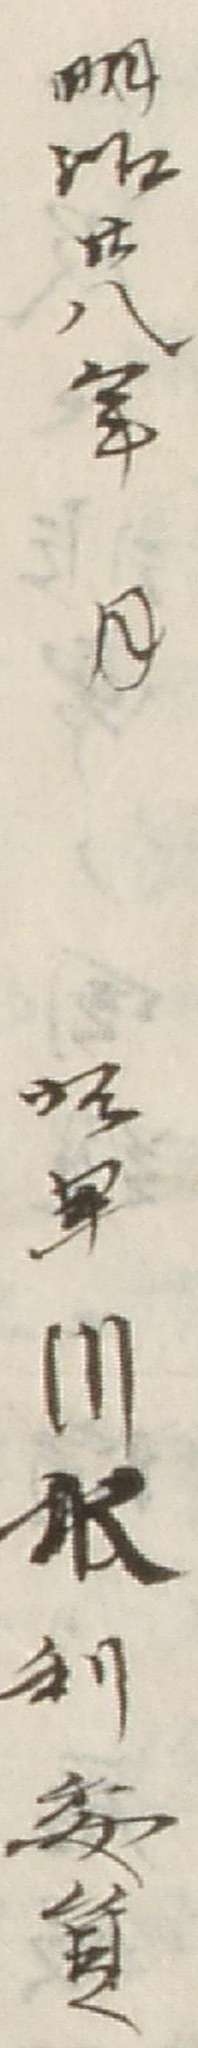明治廿八年月右早川水利委員
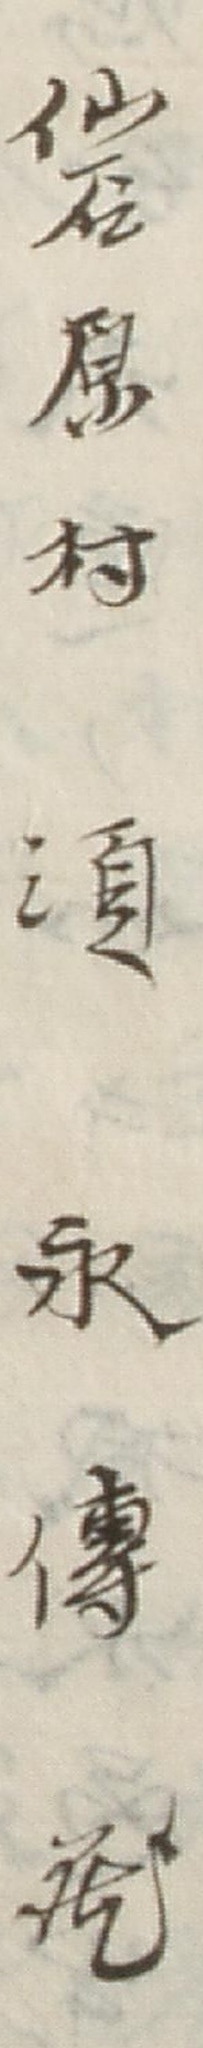仙石原村須永傳蔵
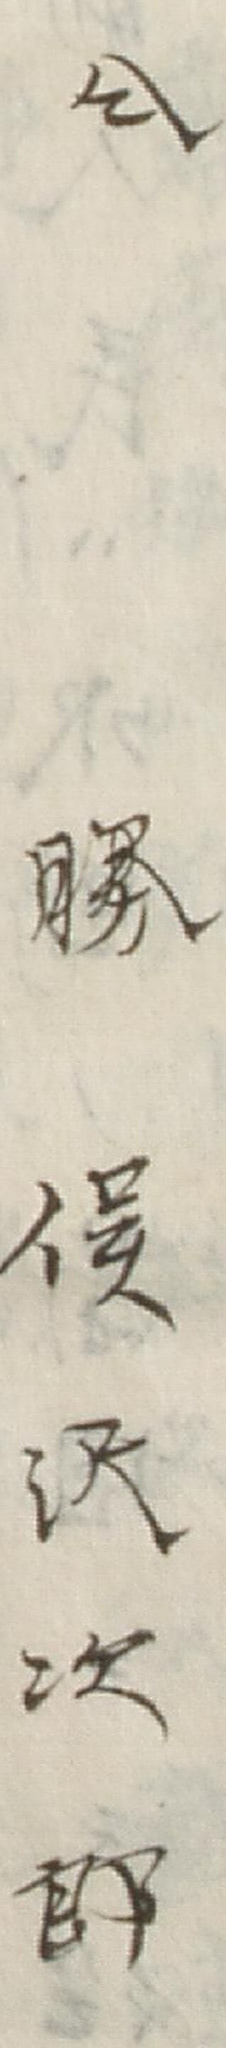仝勝俣沢次郎
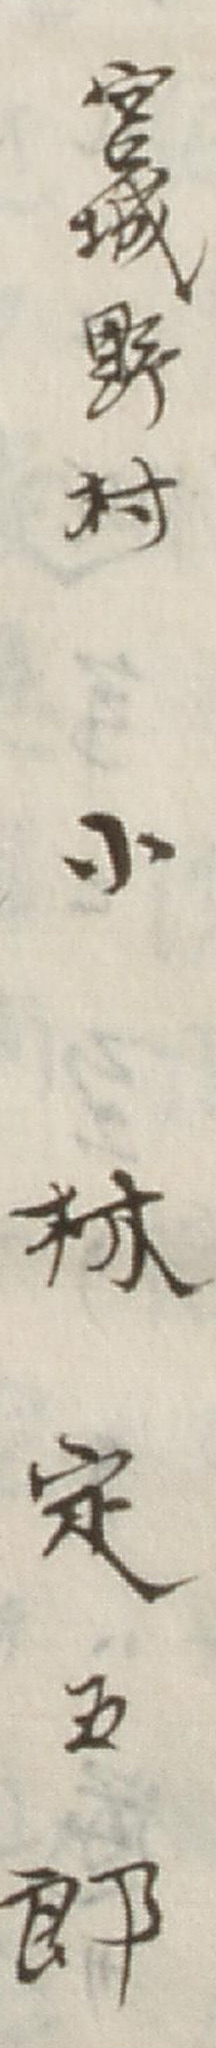宮城野村小林定五郎
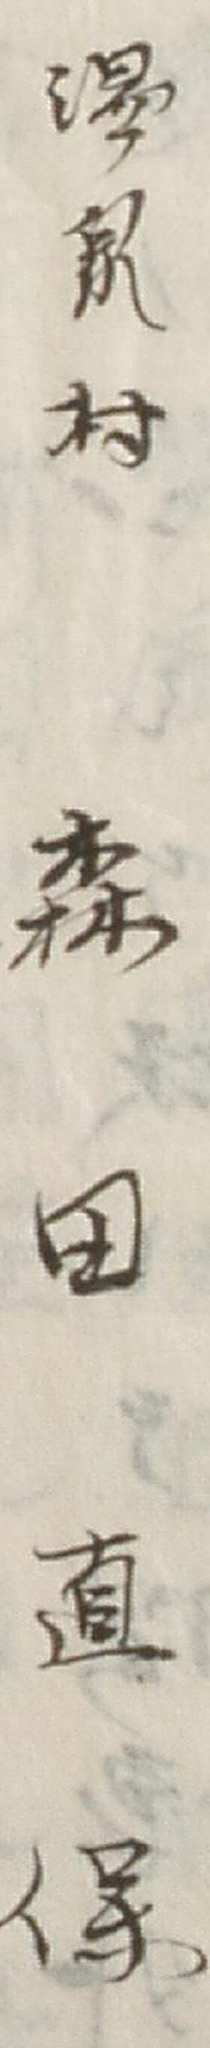湯泉村森田直保
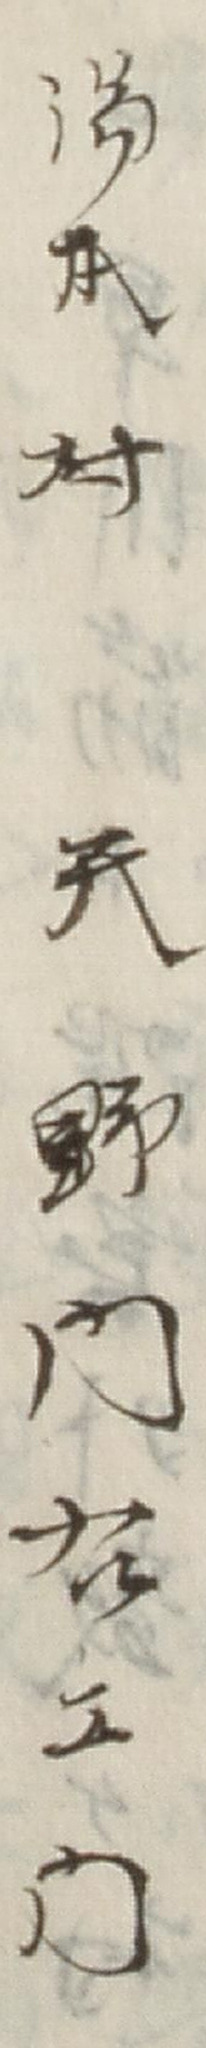湯本村天野門右エ門
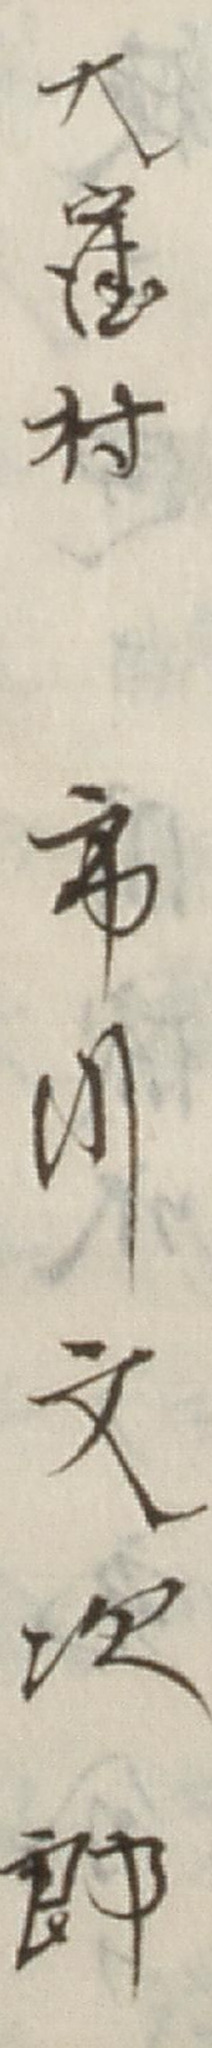大窪村市川文次郎
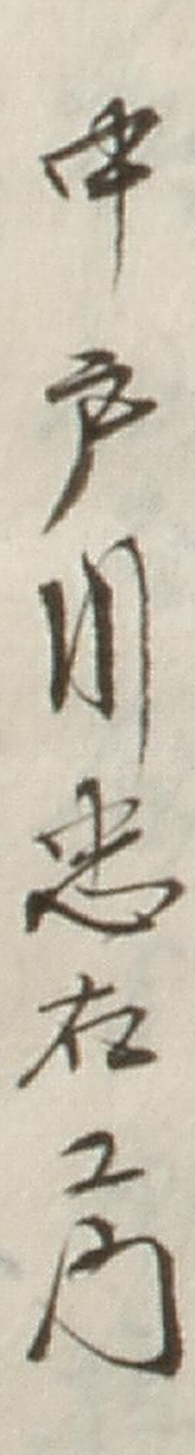仝中戸川忠右エ門

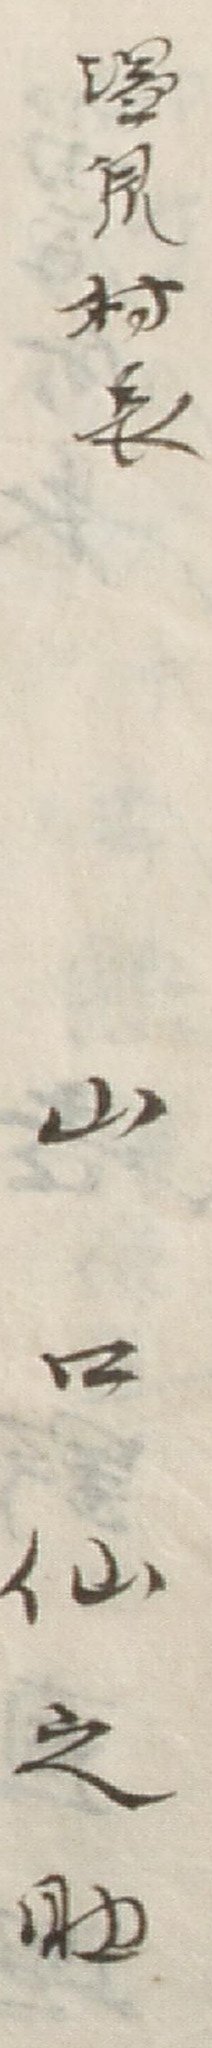温泉村長山口仙之助
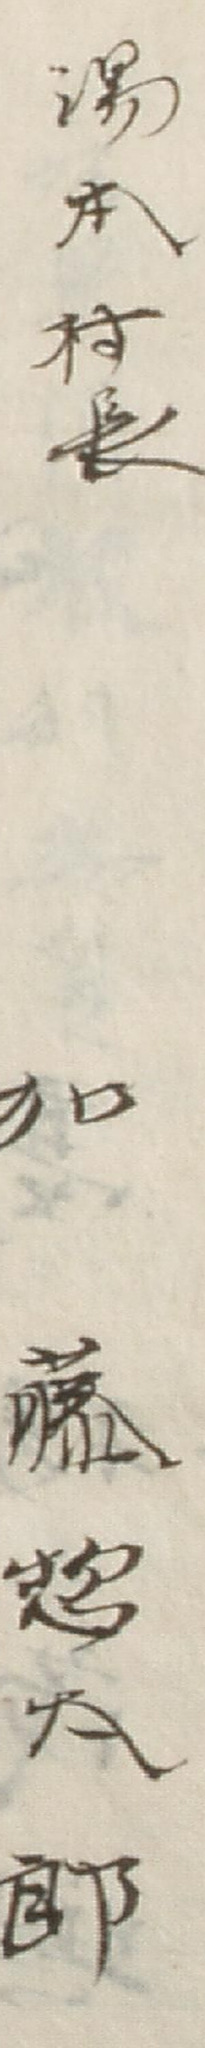湯本村長加藤惣太郎
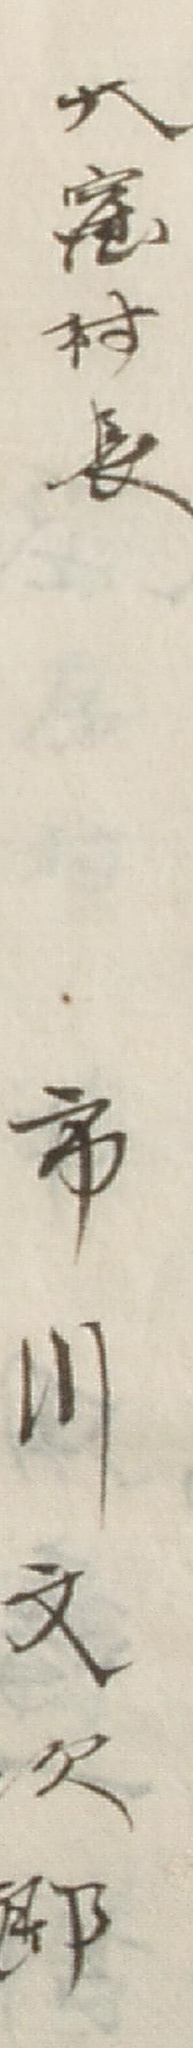大窪村長市川文次郎
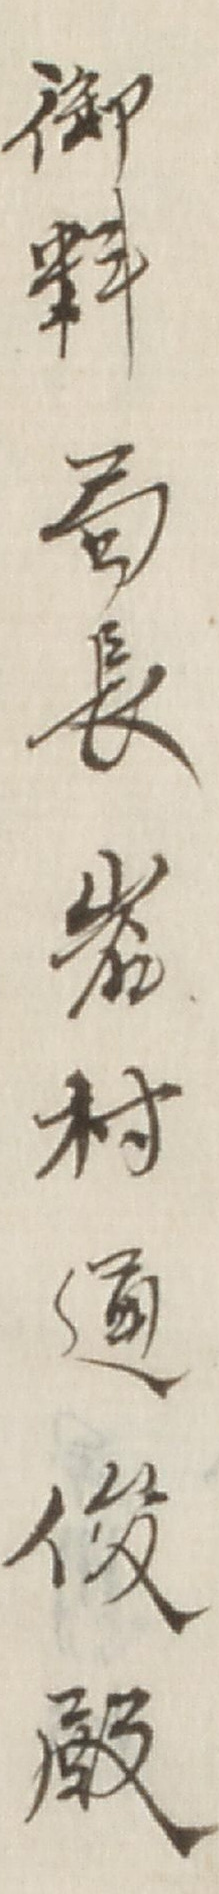御料局長岩村通俊殿
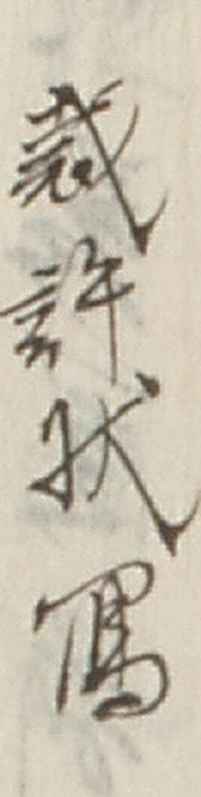裁許状写
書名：箱根湖水使用願　神奈川縣足柄下郡仙石原村外七ヶ町村
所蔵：東京大学地震研究所図書室 Earthquake Research Institute Library, The University of Tokyo, JAPAN
